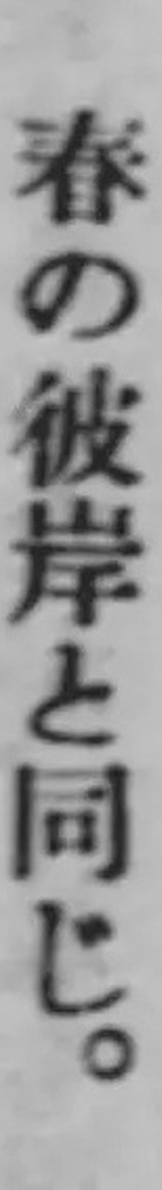春の彼岸と同じ。
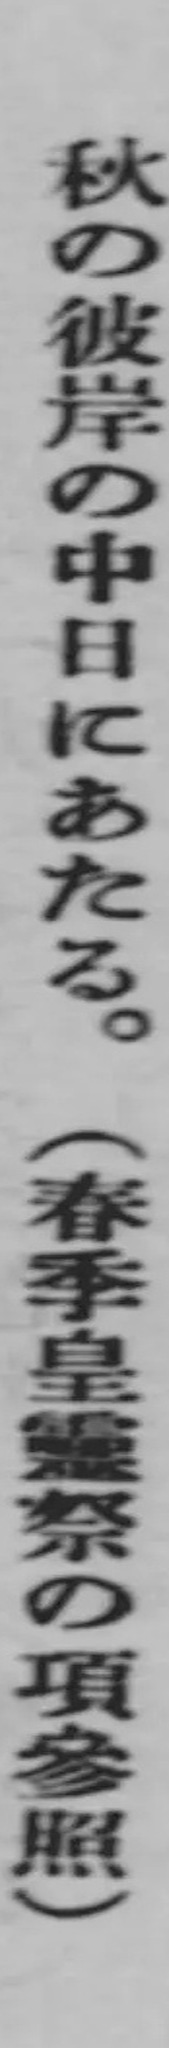秋の彼岸の中日にあたる。(春季皇靈祭の項參照)
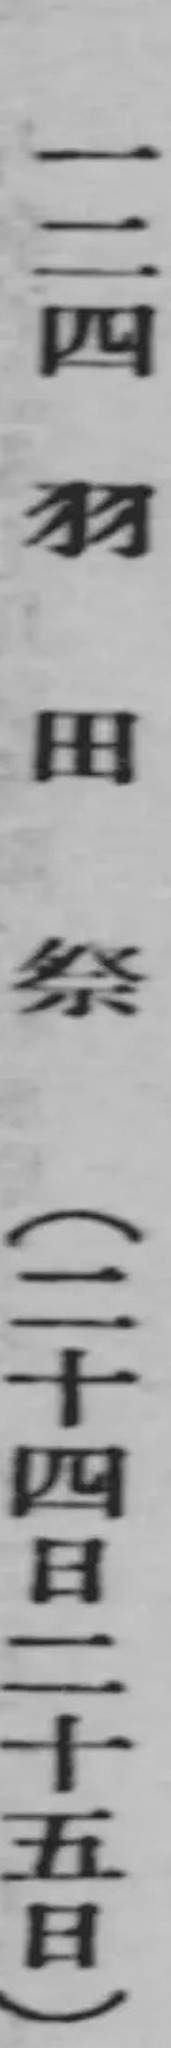一二四羽田祭(二十四日二十五日)
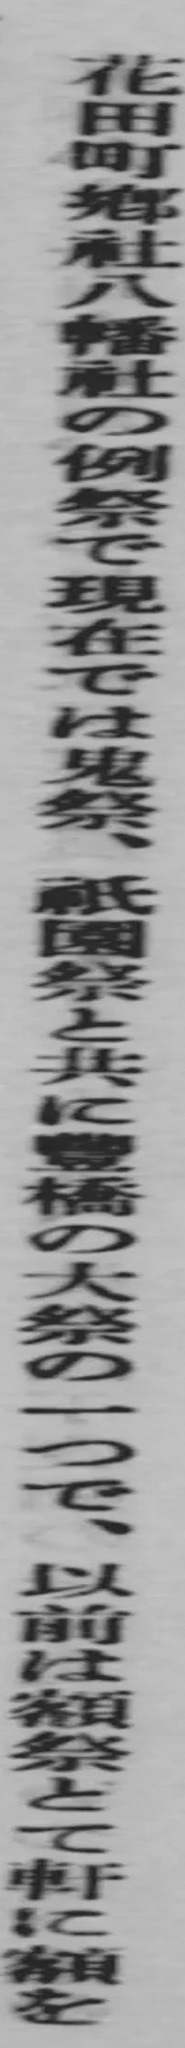花田町鄕社八幡社の例祭で現在では鬼祭、祇園祭と共に豐橋の大祭の一つで、以前は額祭とて軒に額を
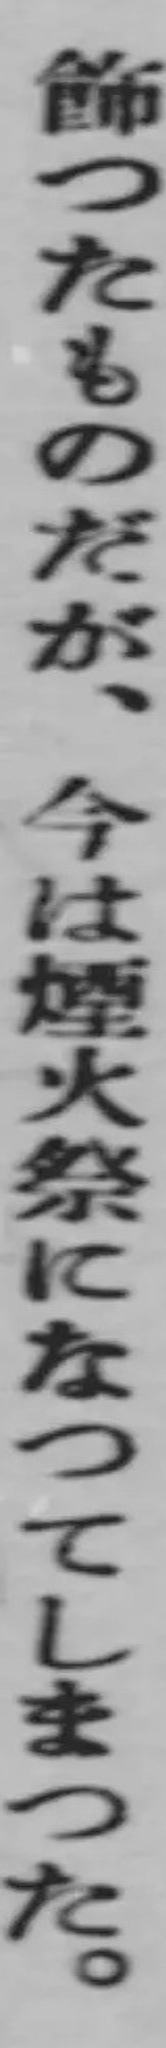飾つたものだが、今は煙火祭になつてしまつた。
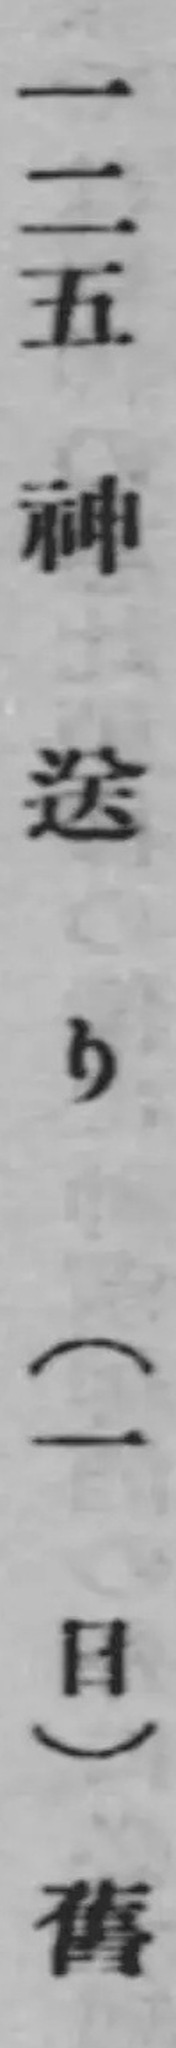一二五神送り(一日)舊
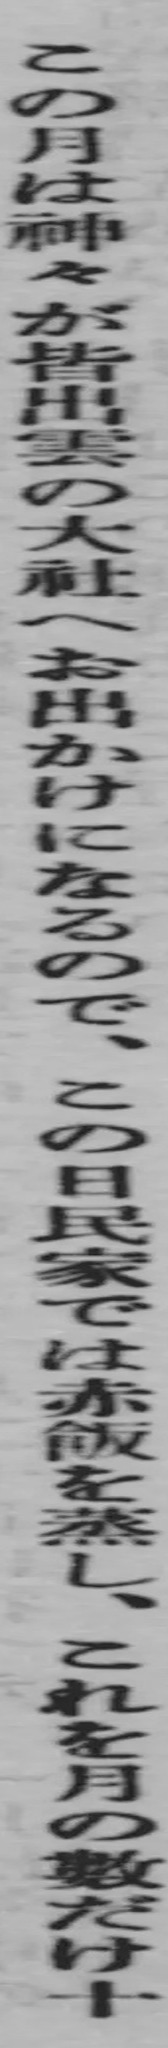この月は神々が皆出雲の大社へお出かけになるので、この日民家では赤飯を蒸し、これを月の數だけ十
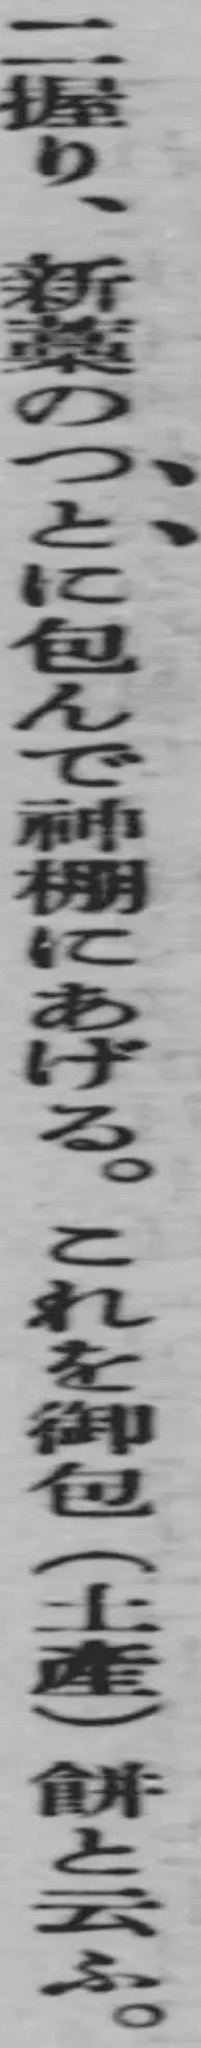二握り、新藁のつとに包んで神棚にあげる。これを御包(土產)餅と云ふ。
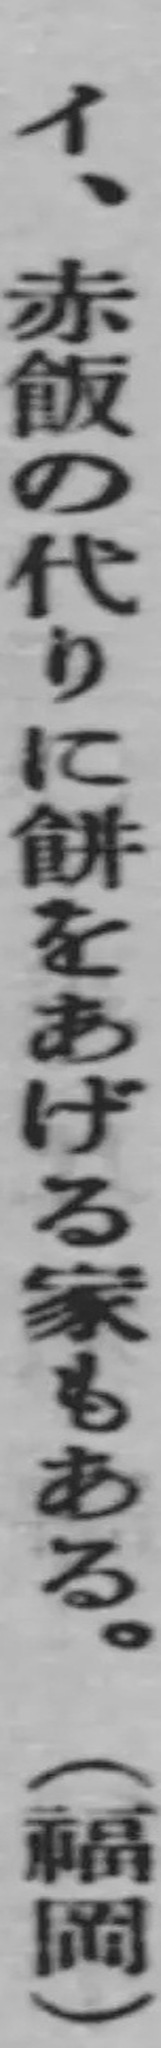イ、赤飯の代りに餅をあげる家もある。(福岡)
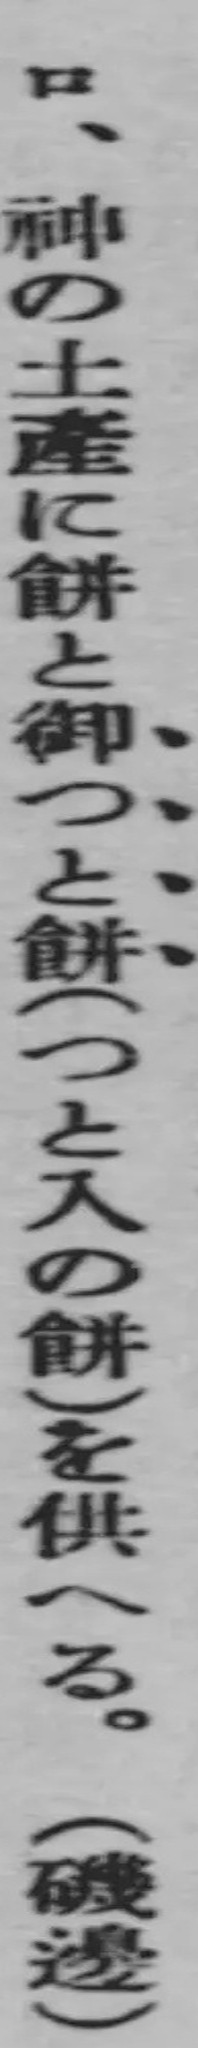ロ、神の土產に餅と御つと餅(つと入の餅)を供へる。(磯邊)
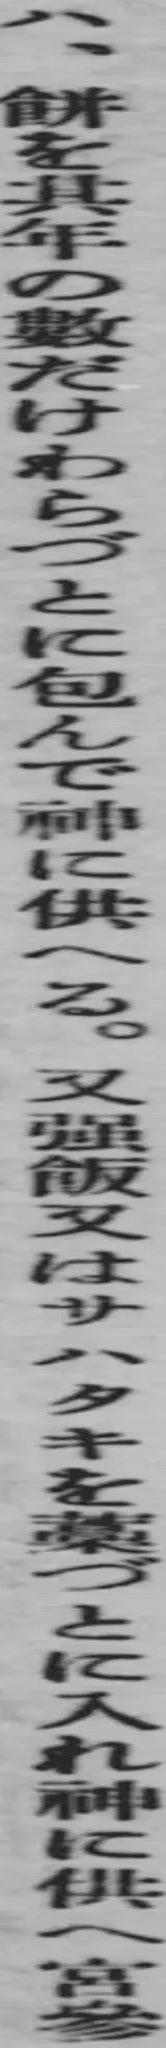ハ、餅を其年の數だけわらづとに包んで神に供へる。又强飯又はサハタキを藁づとに入れ神に供へ宮參
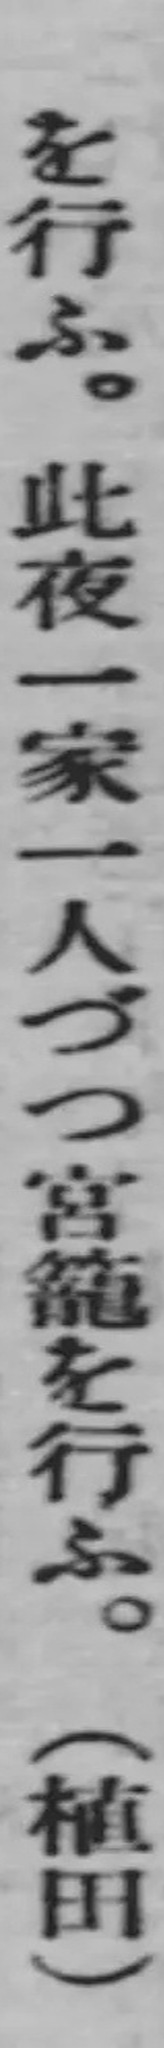を行ふ。此夜一家一人づつ宮籠を行ふ。(植田)
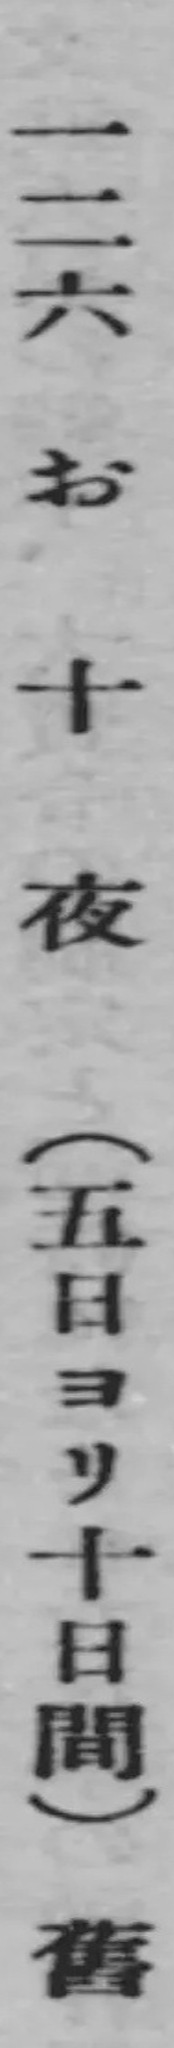一二六お十夜(五日ヨリ十日間)舊
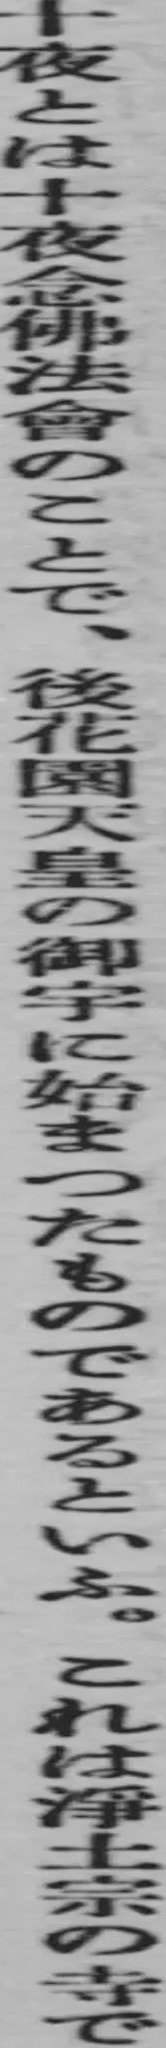十夜とは十夜念佛法會のことで、後花園天皇の御宇に始まつたものであるといふ。これは淨土宗の寺で
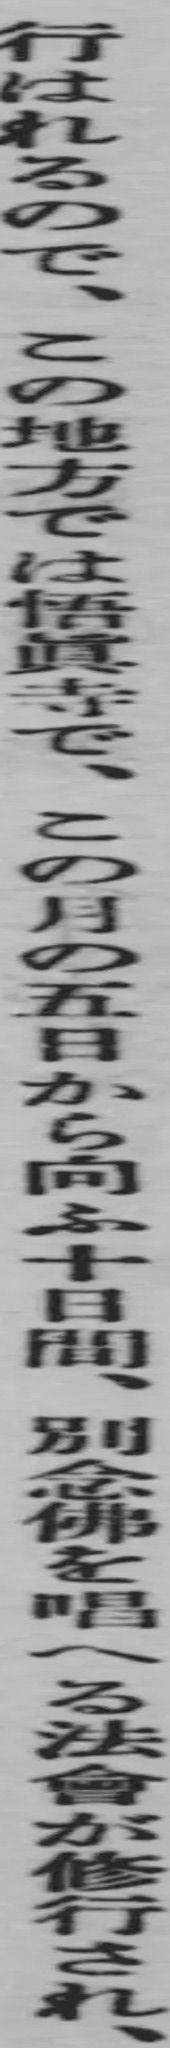行はれるので、この地方では悟眞寺で、この月の五日から向ふ十日間、別念佛を唱へる法會が修行され、
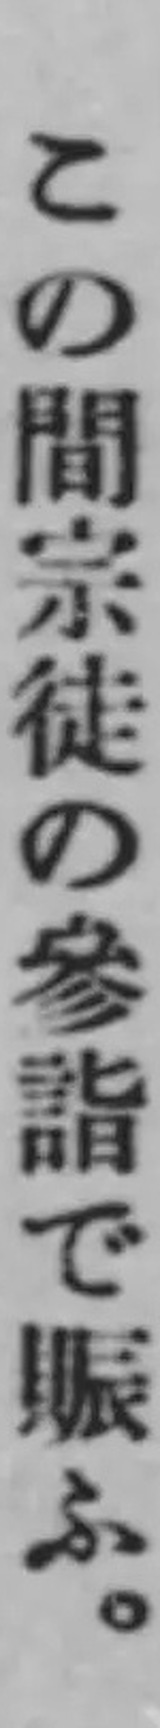この間宗徒の參詣で賑ふ。
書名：豊橋の年中行事
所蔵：国立国会図書館 National Diet Library, JAPAN
